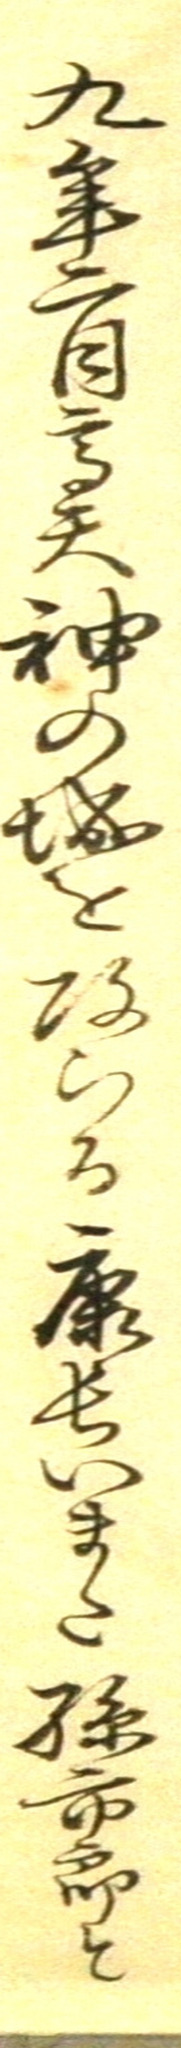九年二月高天神の城を攻らる康長いまた孫市郎と

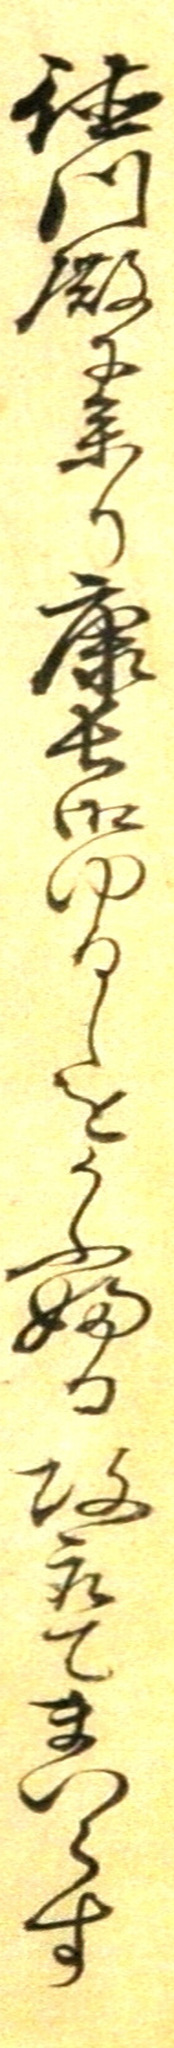徳川殿に参り康長御ゆるしをかふふる攻取てまいらす
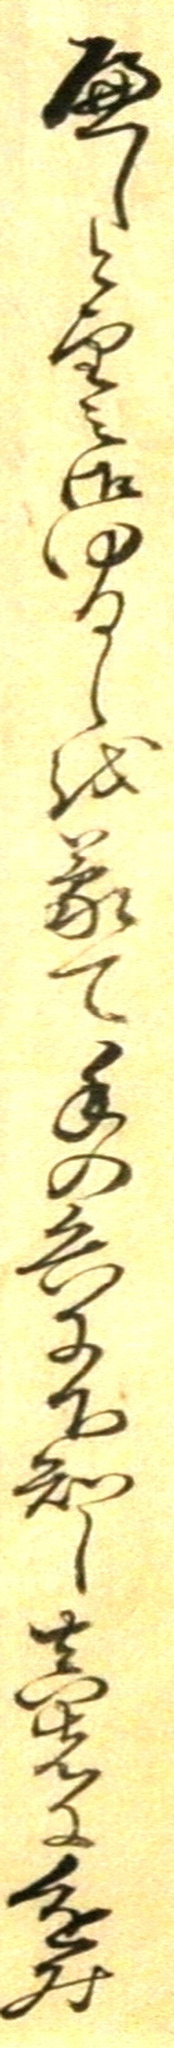へしと望み御ゆるしを蒙て手の兵に下知し真先に進み
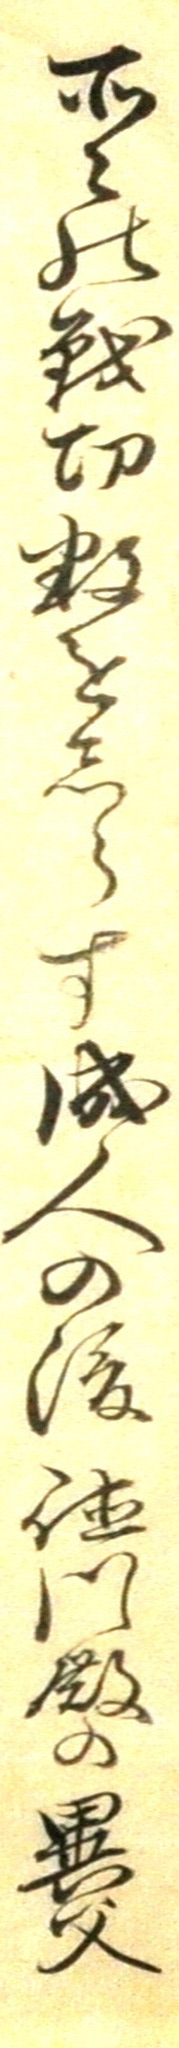所々の戦功数をしらす成人の後徳川殿の異父
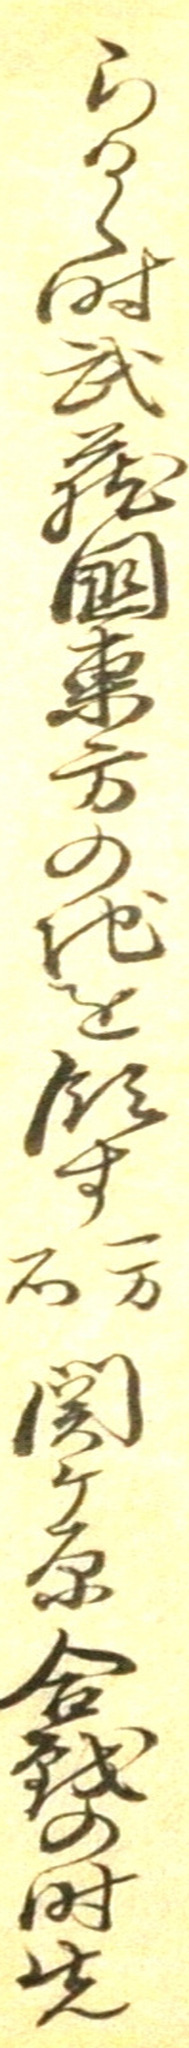らるゝ時武蔵国東方の地を領す一万石関ヶ原合戦の時先
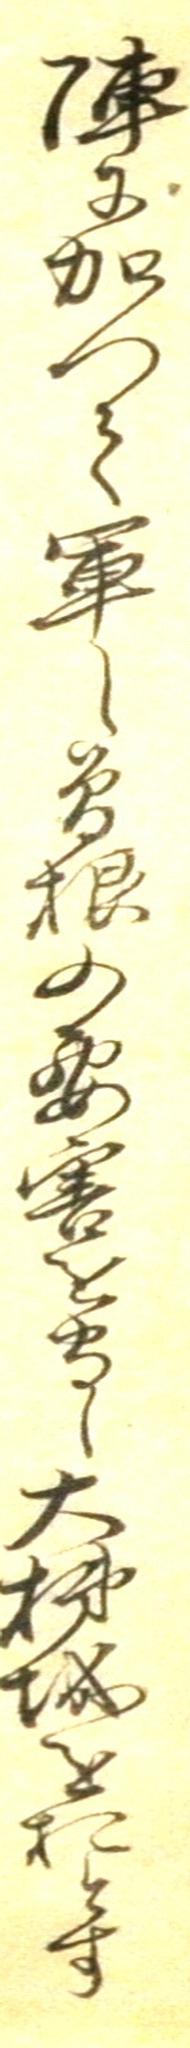陣に加つて軍し曽根の要害を守し大柿城をおとす
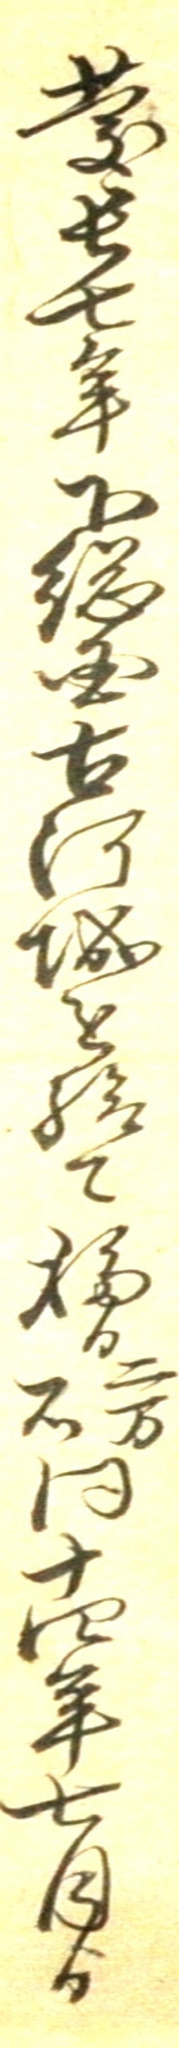慶長七年下総国古河城を給て移る二万石同十四年七月より
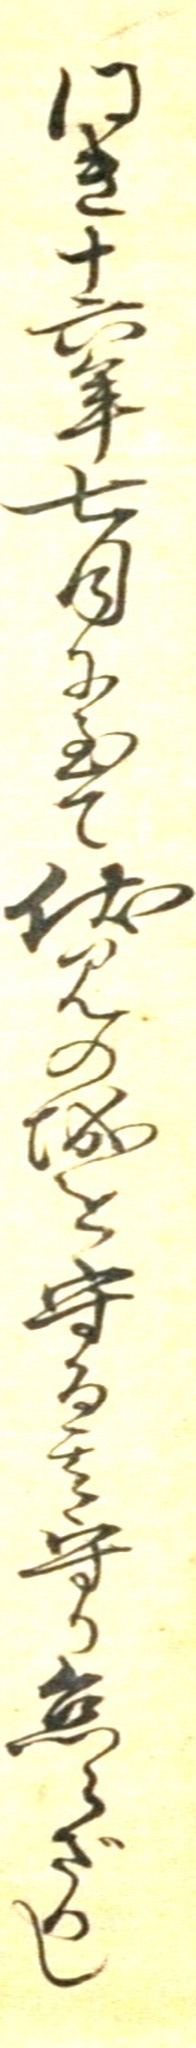同き十六年七月に至て伏見の城を守る其守り怠らざりし
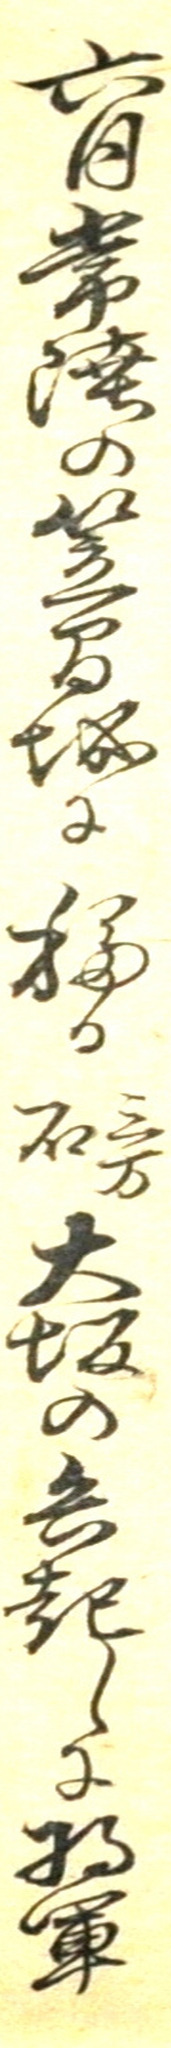六月常陸の笠間城に移る三万石大坂の兵起しに将軍
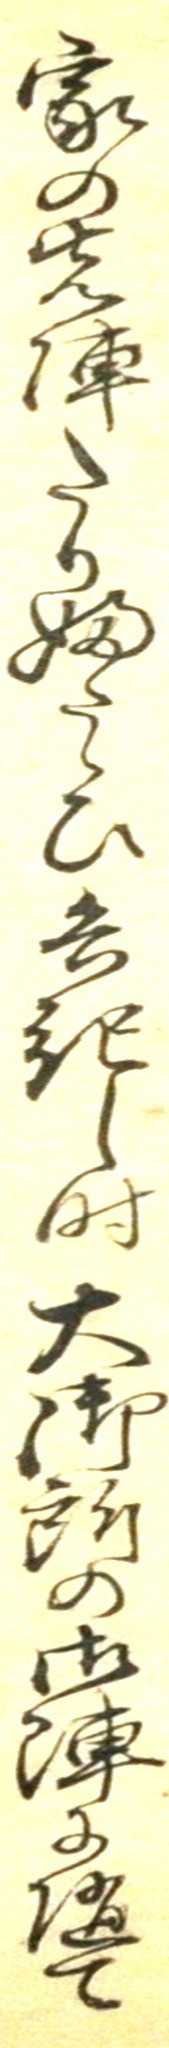家の先陣たりふたゝひ兵起し時大御所の御陣に随て
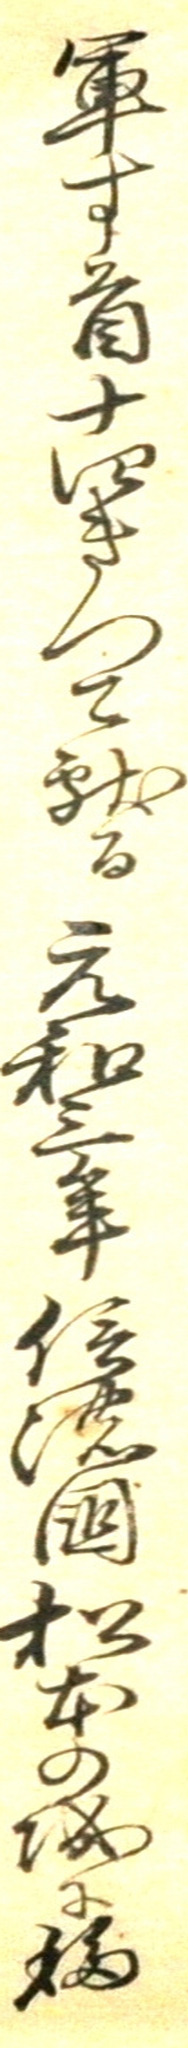軍す首十四きつて献る元和三年信濃国松本の城に移
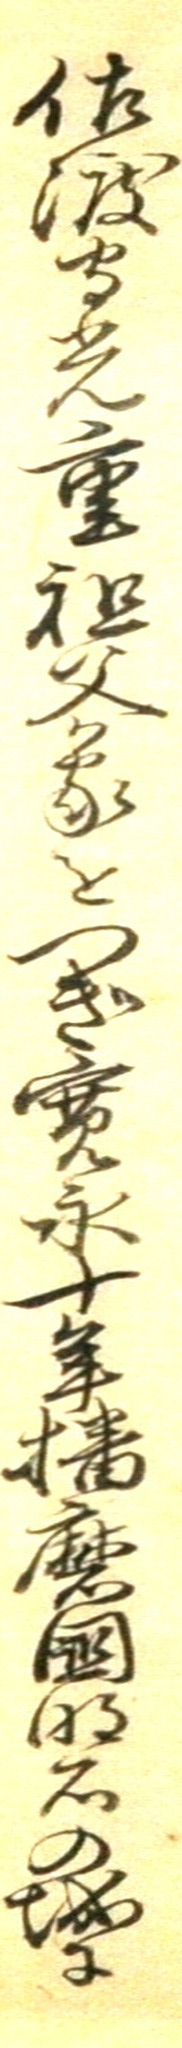佐渡守光重祖父か家をつぎ寛永十年播磨国明石の城に
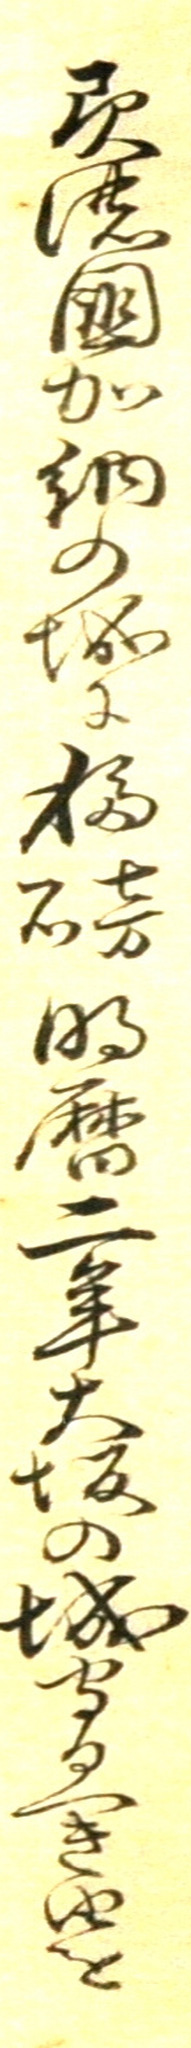美濃国加納の城に移七万石明暦二年大坂の城守るへき由を

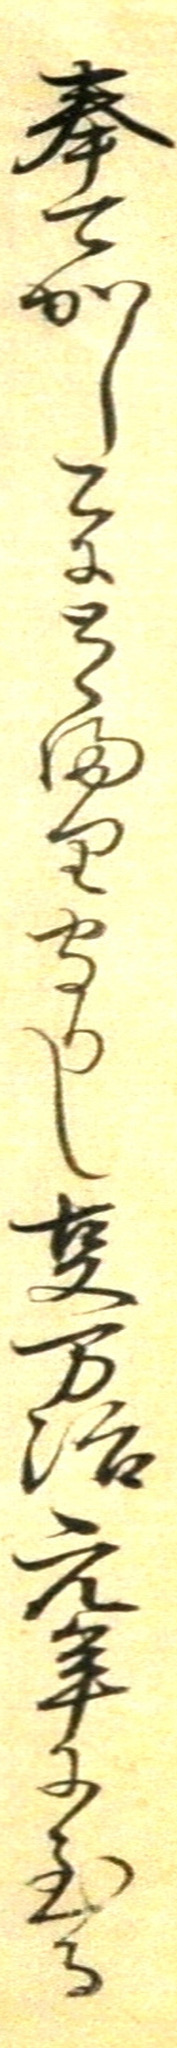奉てかしこにとゝまり守りし事万治元年に至る
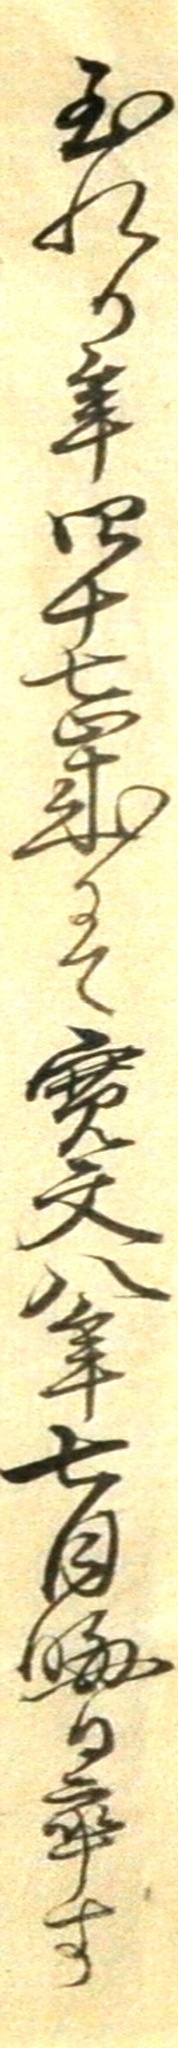至れり年四十七歳にて寛文八年七月晦日卒す
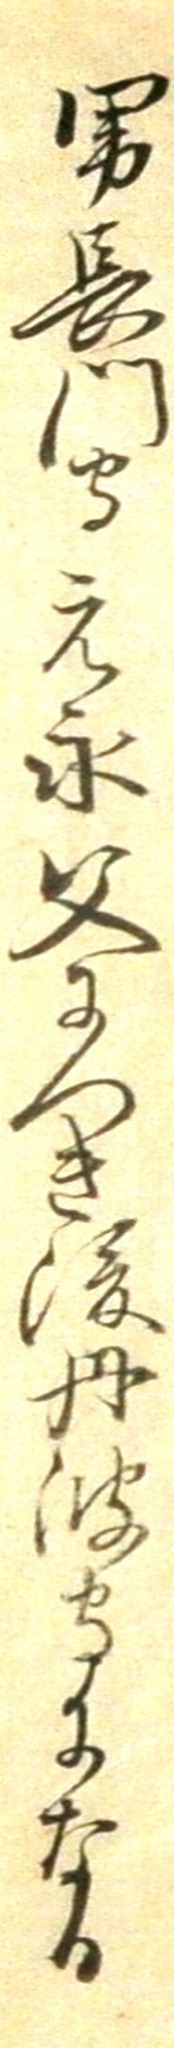男長門守元永父につき後丹波守になる
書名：藩翰譜（四・下）
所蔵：伊那市立高遠町図書館・合同会社AMANE
